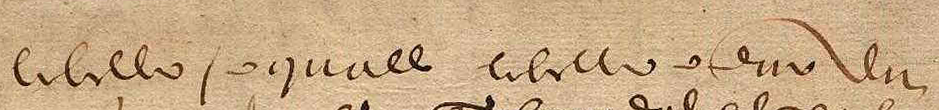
libello / o quall libello o dito dou
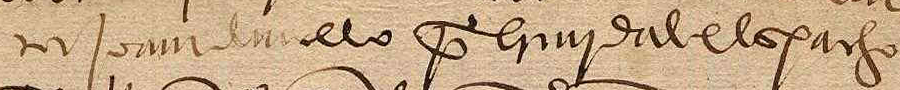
tor Joam de mello p̄o breujdade e despacho
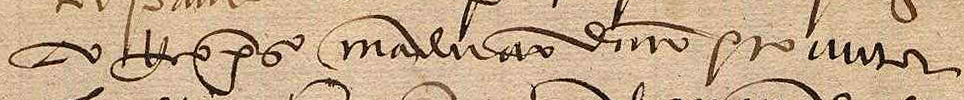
do Reo p̄so mādou ao dicto promotor
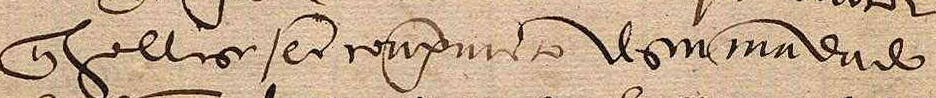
q̄ ho llese / e ē conp̄mēto de seu mādado
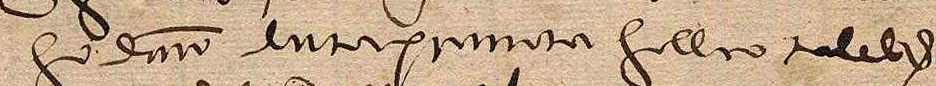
ho dicto doutor promotor ho lleo todo de ꝟ
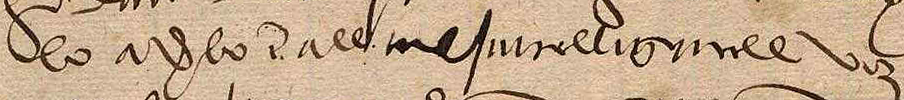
bo a ꝟbo ē allta e Jmtelligyuell voz
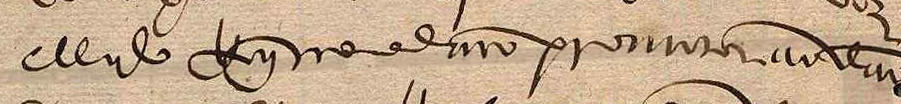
e llydo Req̄reo o dicto promotor ao dicto
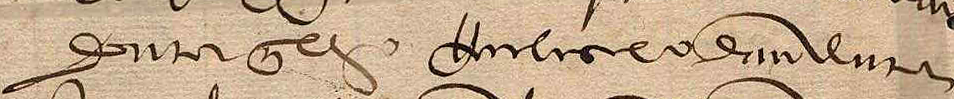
doutor q̄ lho Recebese e o dicto doutor
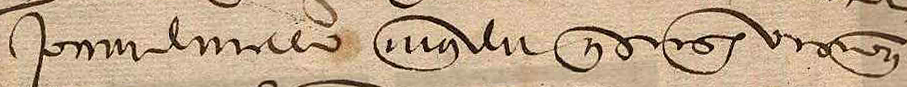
Joam de mello mādou q̄ se esp̄vese o q̄
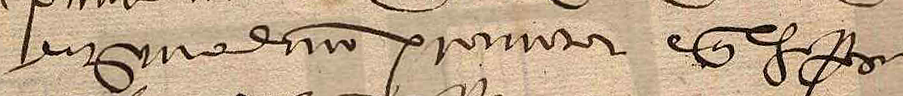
dizya o dicto promotor e q̄ lhe fose
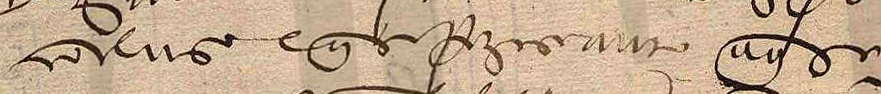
cōcluso e q̄ se fezese auto a q̄ se
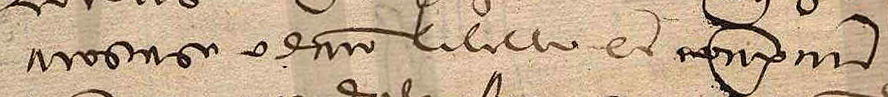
acostase o dicto libello e ē conp̄mē
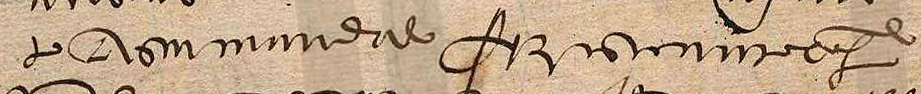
to de seu mandado fyz este auto e o Ldo
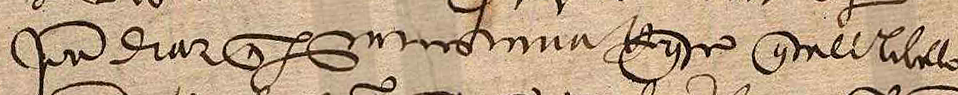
Joā diaz q̄ ꝑsente estaua Req̄reo q̄ tall libello
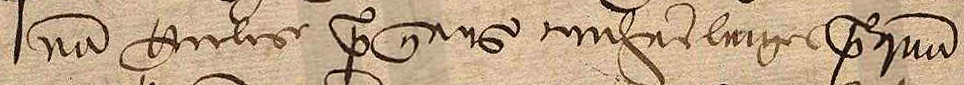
nā Recebese p̄oq̄ a yso tynha ēbargos p̄oquā
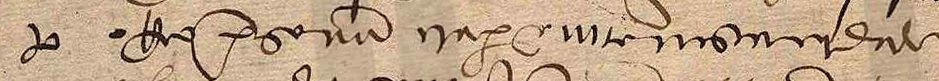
to o Reo p̄so nā era ꝑsemte nesta cydade
